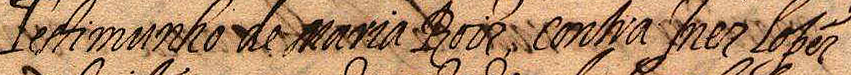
Testimunho de Maria Roiz̄, contra Jnez Lopez̄
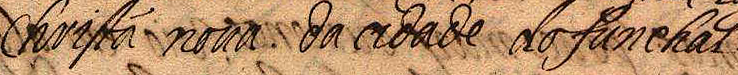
Christa̅ noua da cidade do funchal
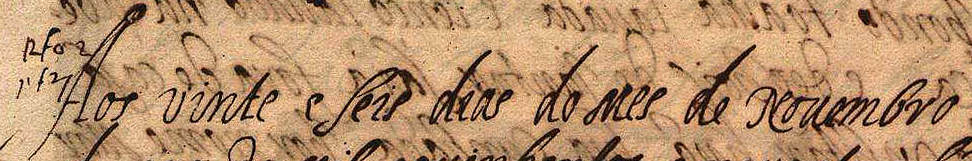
Aos vinte e seis dias do Mes de Nouembro
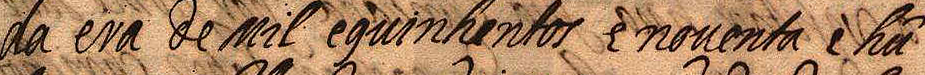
da era de Mil e quinhentos E nouenta e hu̅
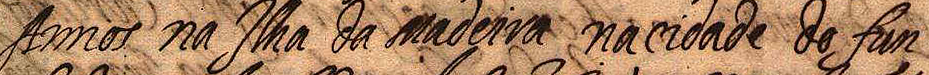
Annos na Jlha da Madeira na çidade do fun
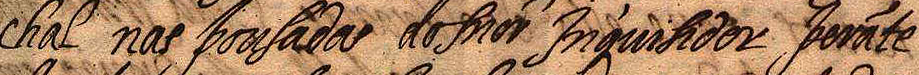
chaL nas pousadas do sno̅r Jnquisidor pera̅te
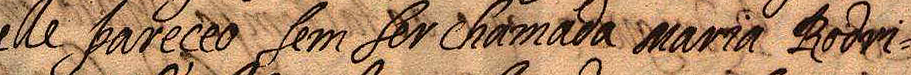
elle pareçeo sem ser chamada Maria Rodri
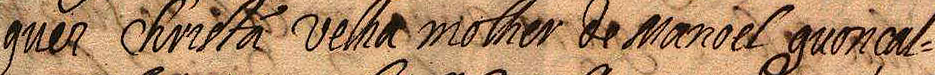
guez christa̅ velha molher de Manoel guonçal
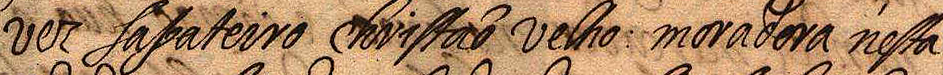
vez sapateiro christão velho moradora nesta
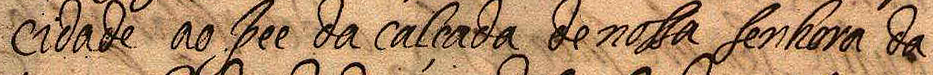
çidade ao pee da calçada de nossa senhora da
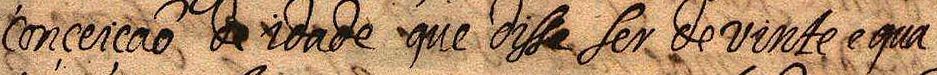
conçeição de idade que disse ser de vinte e qua
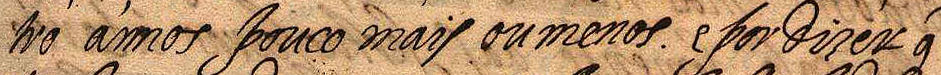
tro annos pouco mais ou menos. E por dizer q̅
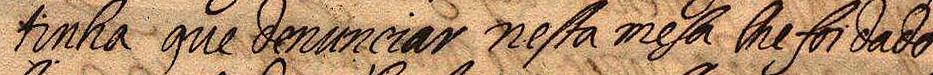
tinha que denunçiar nesta mesa lhe foi dado
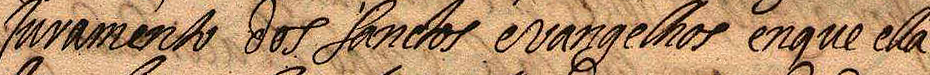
Juramento dos sanctos evangelhos en que ella
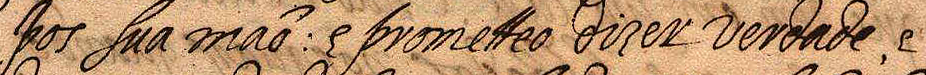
pos sua maõ: E prometteo dizer verdade, E
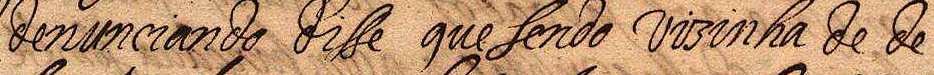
denunciando disse que sendo vizinha de de
